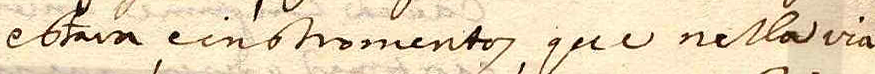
estava, e instromentos, que nella via
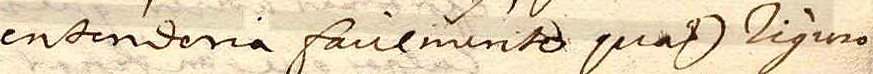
entenderia facilmente quaõ Riguro
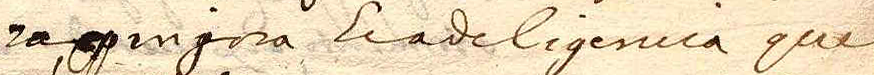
za, e perigoza he a deligencia, que
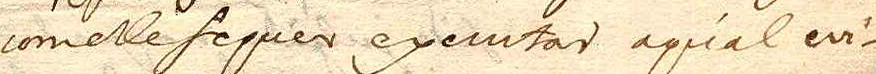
com elle sequer executar a qual evi
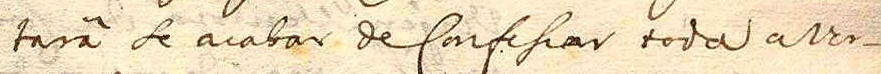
tarâ se acabar de Confessar toda a ver
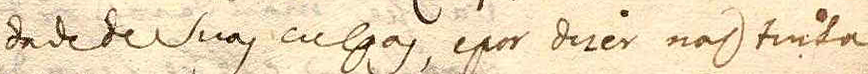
dade de Suas culpas, e por dizer naõ tinha
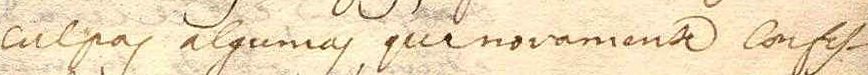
culpas algumas, que novamente Confes
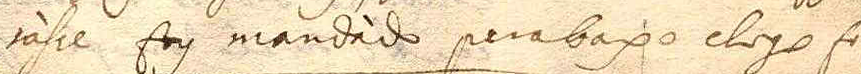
sàsse foy mandàdo pera baxo e logo fo
